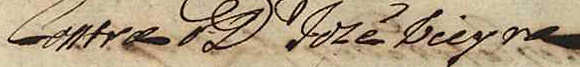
Contra o Dr Iozé Vieyra
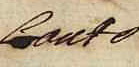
Couto
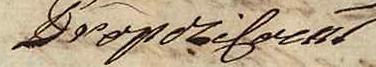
PropoziCoen̄s
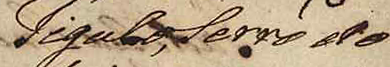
TiguCo, serro do
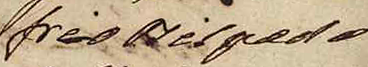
frio Bispado
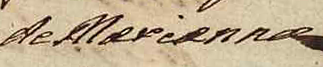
de Marianna
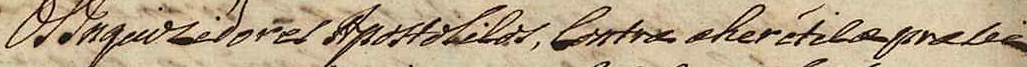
Os Inquizidores Apostolicos, Contra a herética pravi
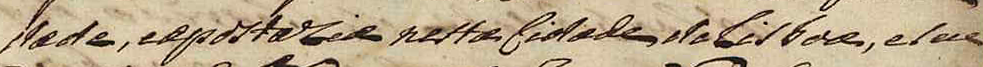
dade, e apostazia nesta Cidade de Lisboa, e seu
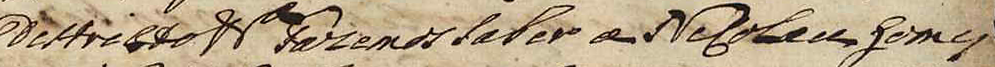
destricto &ra Fazemos saber a NeCoLau Gomes
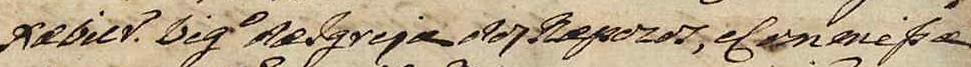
xavier. vigo da Igreja dos Rapozos, e Commissa
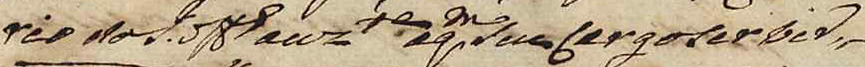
rio do s. off.o auzte a qm seu Cargo servir
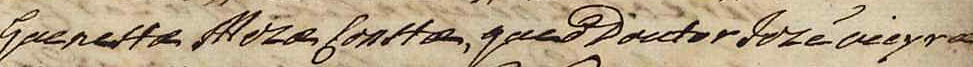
Que nesta Meza Consta, que o Doutor Iozé vieyra
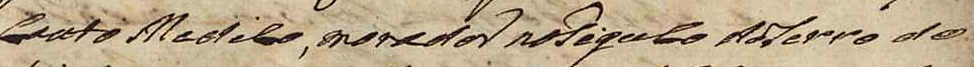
Couto Medico, morador no TiguCo do serro do
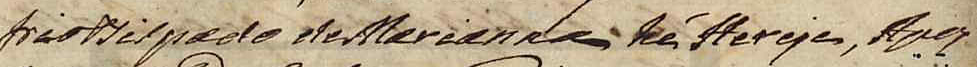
frio Bispado de Marianna hé Hereje, Apos
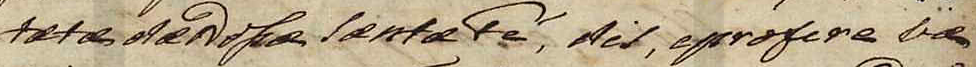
tata da Nossa santa Fé, dis, e profere va
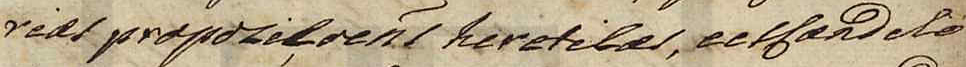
rias propoziçoeñs hereticas, e escandalo
